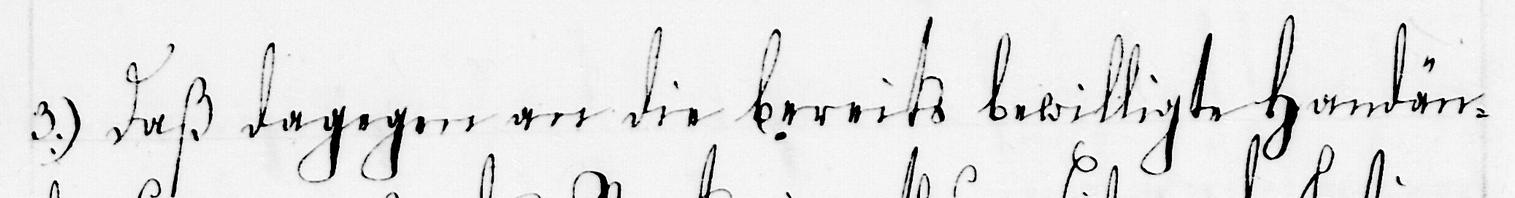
3.) Daß dagegen an die bereits bewilligte Handän¬
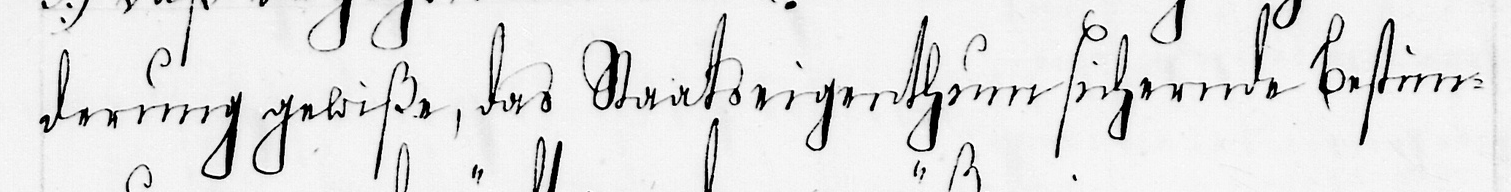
derung gewiße, das Staatseigenthum sichernde Bestim¬
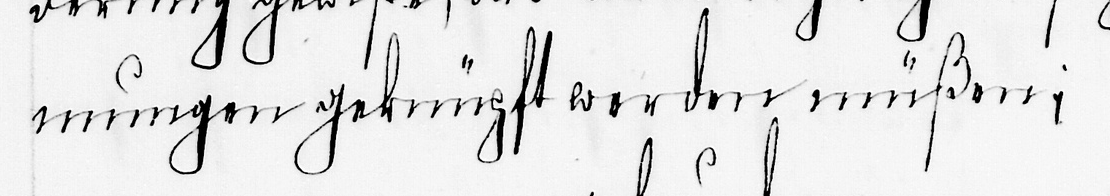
mungen geknüpft werden müßen;
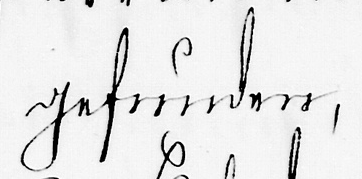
gefunden,
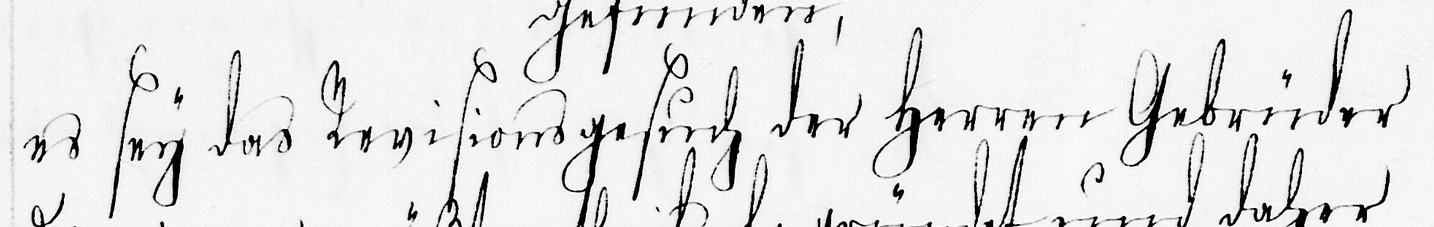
es sey das Revisionsgesuch der Herren Gebrüder
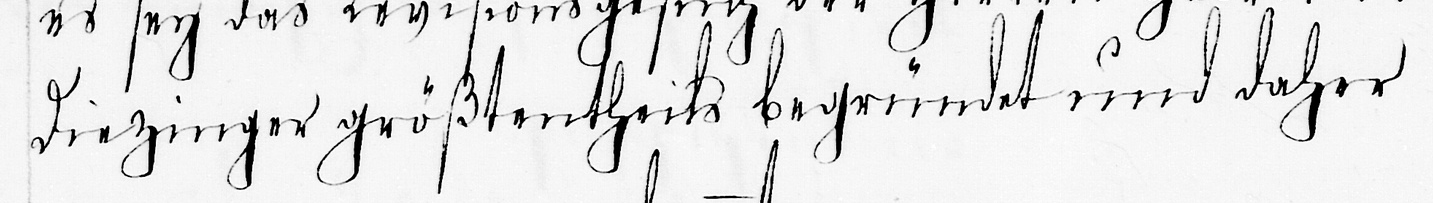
Diezinger größtentheils begründet und daher
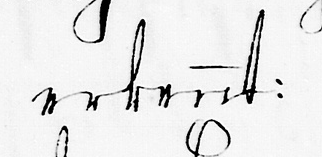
erkennt:
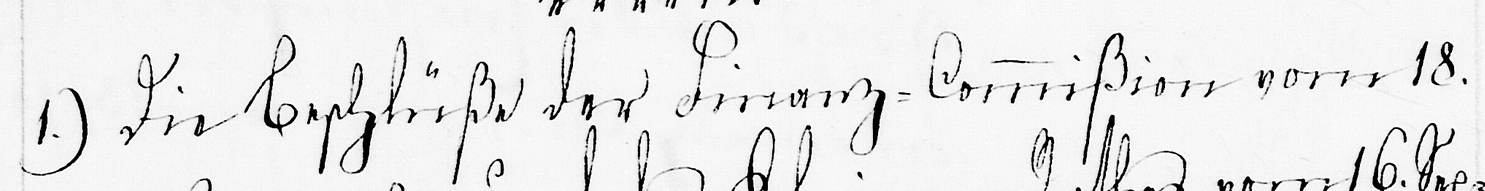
1.) Die Beschlüße der Finanz-Commißion vom 18.
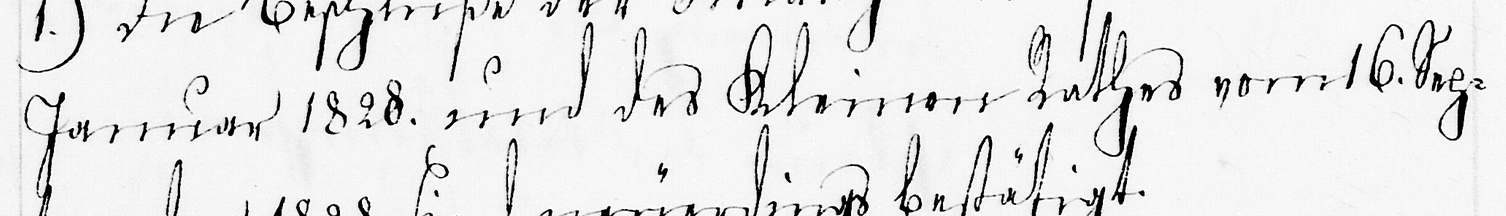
Januar 1828. und des Kleinen Rathes vom 16. Sep¬
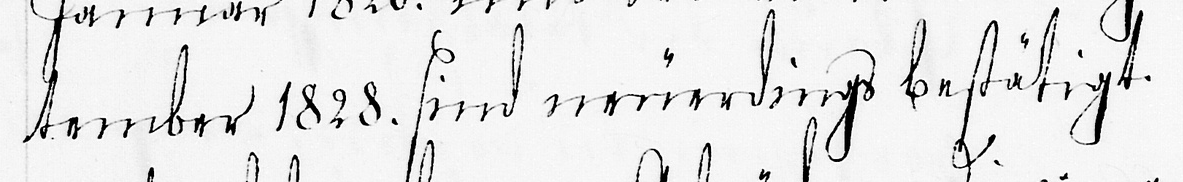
tember 1828. sind neuerdings bestätigt.
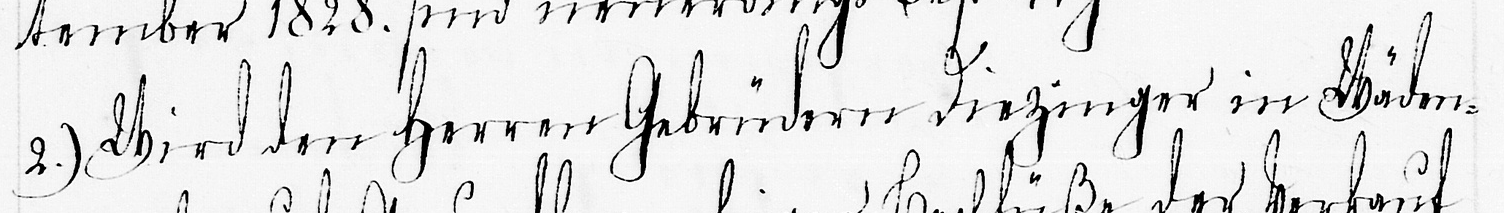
2.) Wird den Herren Gebrüdern Diezinger in Wäden¬
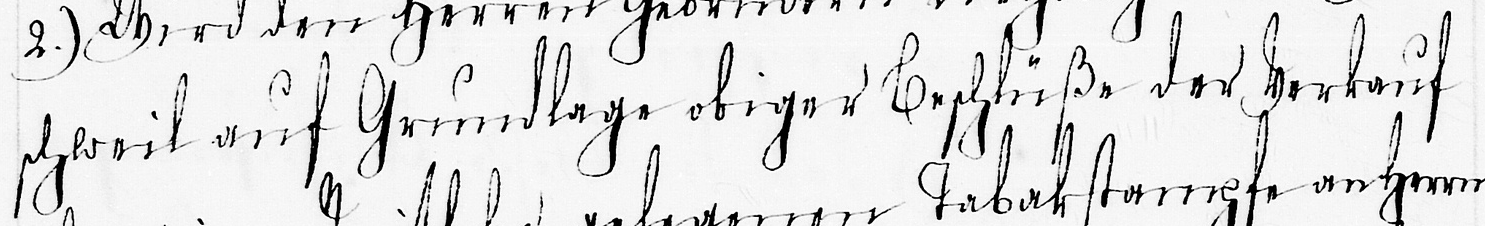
schweil auf Grundlage obiger Beschlüße der Verkauf
